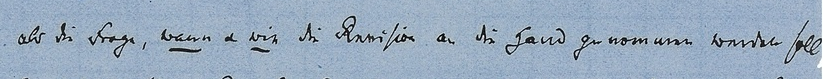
als die Frage, wann & wie die Revision an die Hand genommen werden soll,
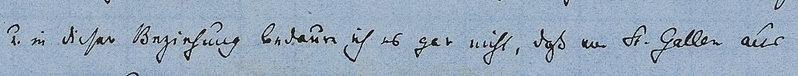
u. in dieser Beziehung bedaure ich es gar nicht, daß von St. Gallen aus
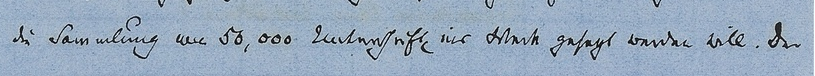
die Sammlung von 50,000 Unterschriften ins Werk gesetzt werden will. Der
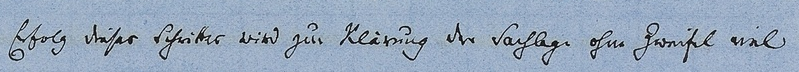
Erfolg dieses Schrittes wird zur Klärung der Sachlage ohne Zweifel viel
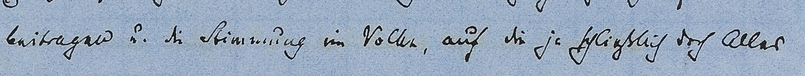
beitragen u. die Stimmung im Volke, auf die ja schließlich doch Alles
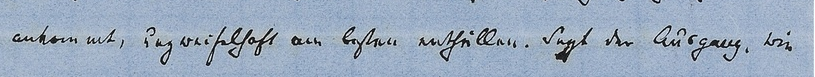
ankommt, unzweifelhaft am besten enthüllen. Setzt der Ausgang, wie
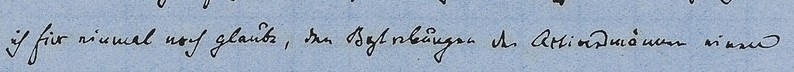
ich für einmal noch glaube, den Bestrebungen der Actionsmänner einen
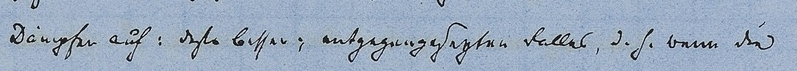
Dämpfer auf: desto besser; entgegengesetzten Falles, d. h. wenn die
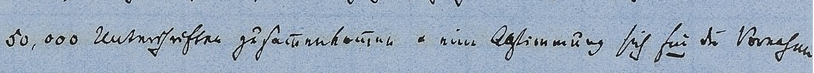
50,000 Unterschriften zusammenkommen & eine Abstimmung sich für die Vornahme
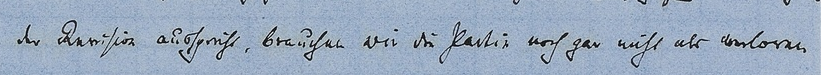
der Revision ausspricht, brauchen wir die Partie noch gar nicht als verloren
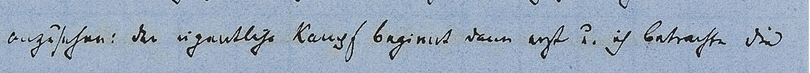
anzusehen: der eigentliche Kampf beginnt dann erst u. ich betrachte die
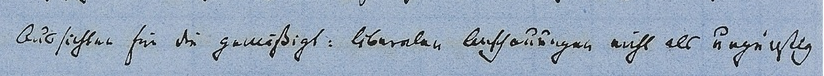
Aussichten für die gemäßigt-liberalen Anschauungen nicht als ungünstig.
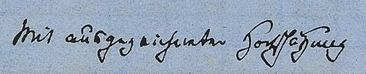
Mit ausgezeichneter Hochschätzung
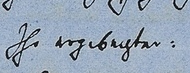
Ihr ergebenster:
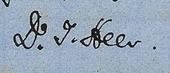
Dr J. Heer.
